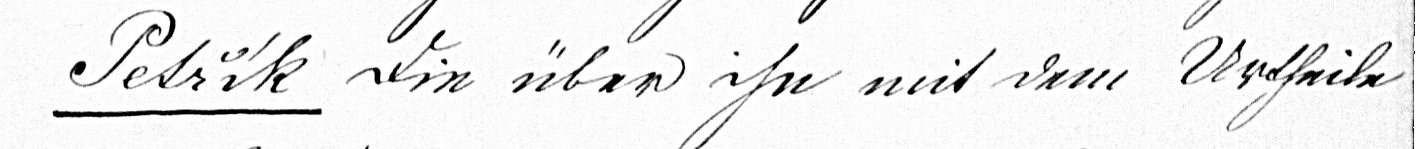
Petrxxk die über ihn mit dem Urtheile
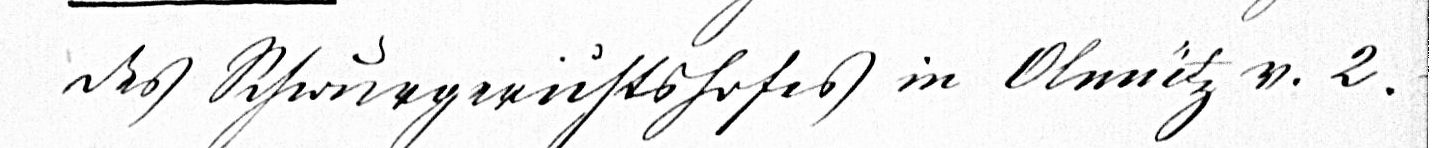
des Schwurgerichtshofes in Olmütz v. 2.
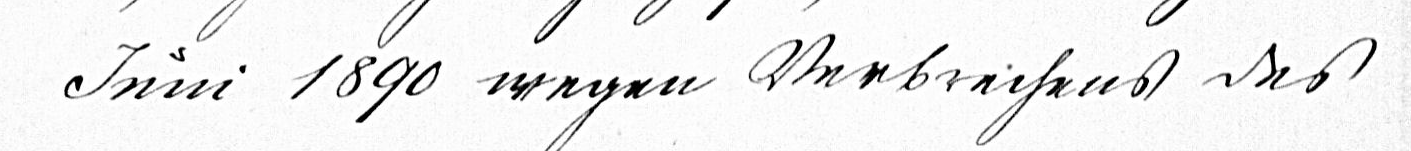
Juni 1890 wegen Verbrechens des
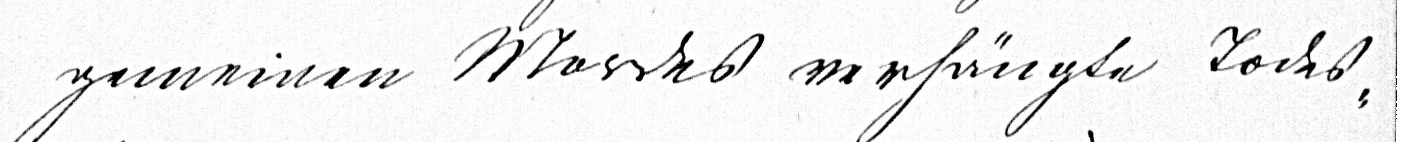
gemeinen Mordes verhängte Todes¬
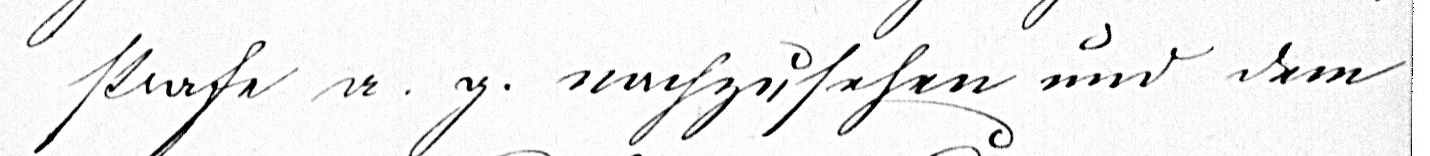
strafe a. g. nachzusehen und dem
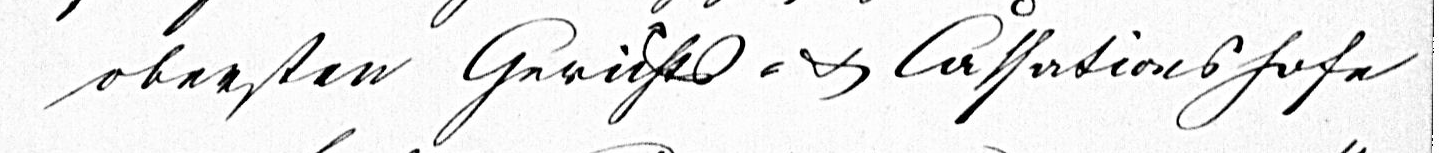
obersten Gerichts- / Cassationshofe
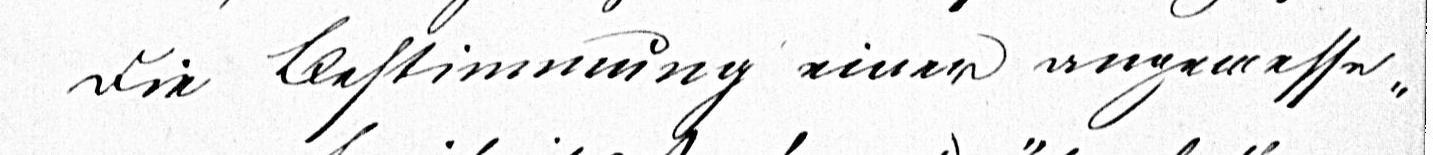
die Bestimmung einer angemesse¬
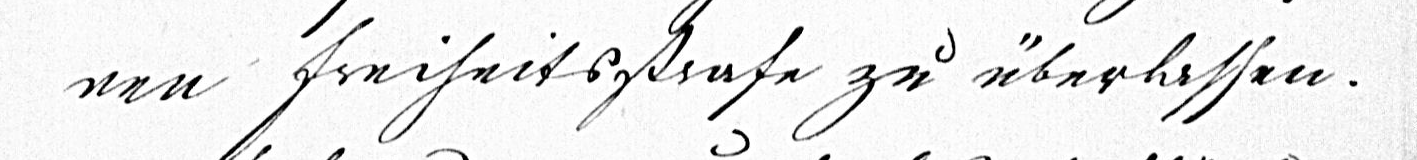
nen Freiheitsstrafe zu überlassen.
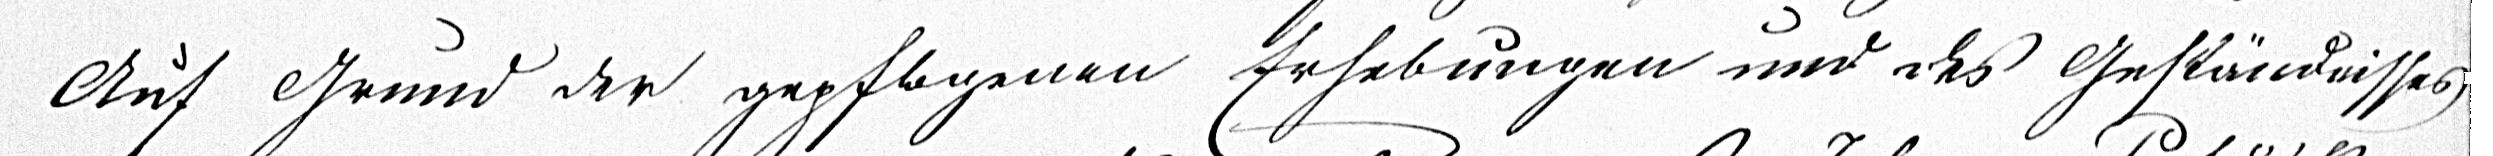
Auf Grund der gepflogenen Erhebungen und des Geständnisse,
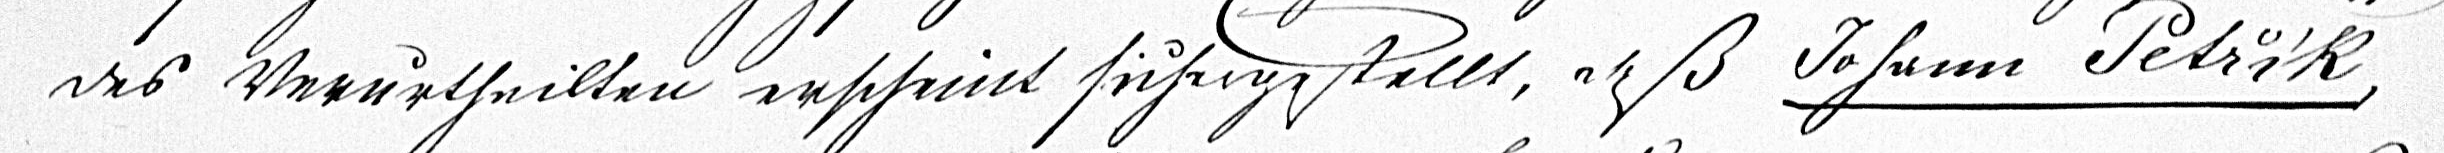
des Verurtheilten erscheint sichergestellt, daß Johann Petrxx,
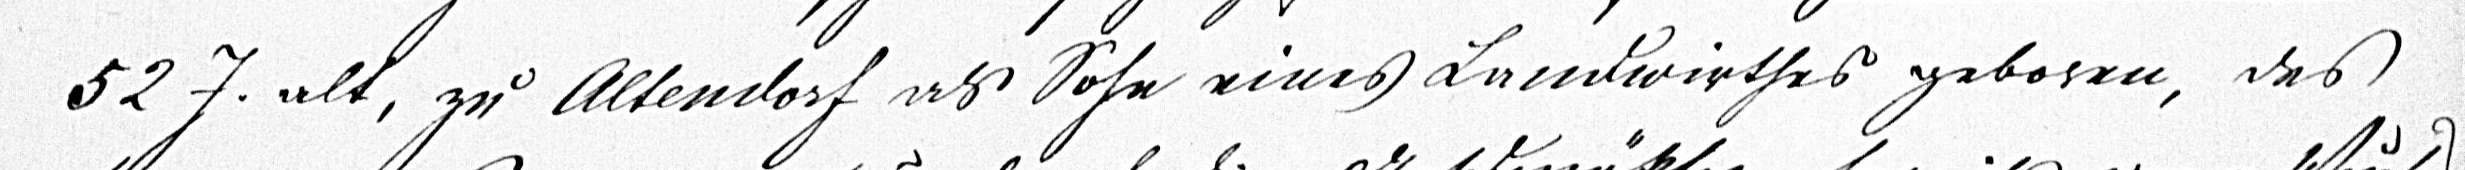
52 J. alt, zu Altendorf as Sohn eines Landwirthes geboren, des
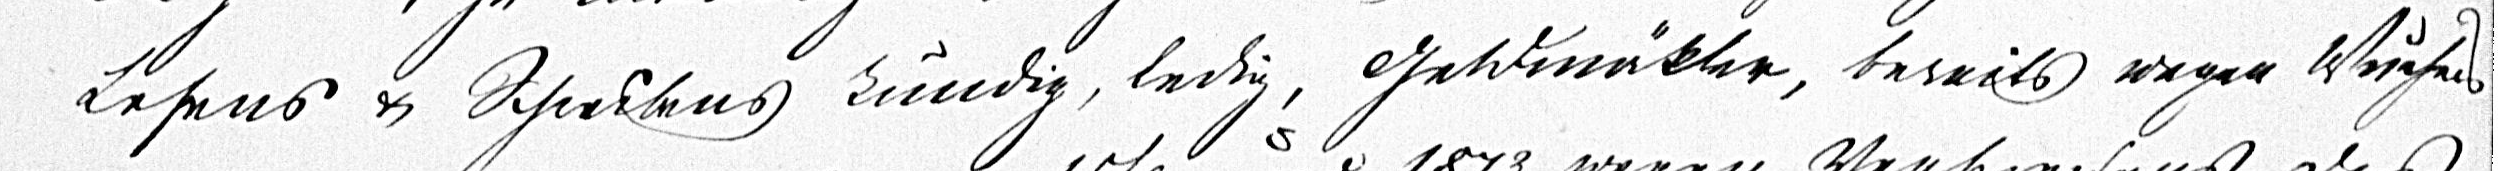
Lesens & Schxxbens kundig, ledig, Geldmäkler, bereits wegen Wuchers
